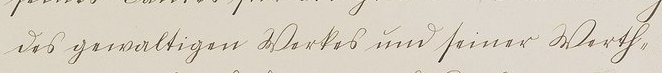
des gewaltigen Werkes und seiner Werth-
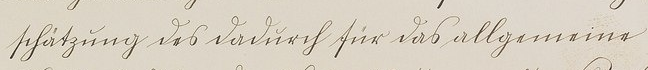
schätzung des dadurch für das allgemeine
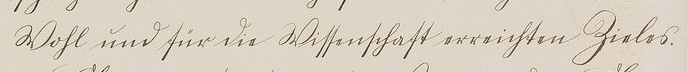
Wohl und für die Wissenschaft erreichten Zieles.
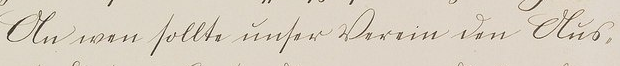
An wen sollte unser Verein den Aus-
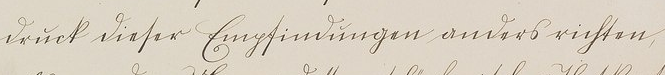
druck dieser Empfindungen anders richten,
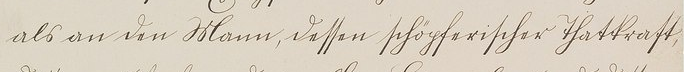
als an den Mann, dessen schöpferischer Thatkraft,
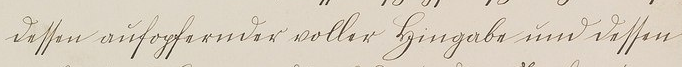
dessen aufopfernder voller Hingabe und dessen
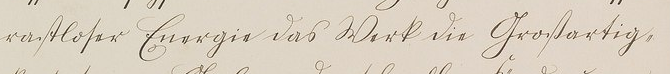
rastloser Energie das Werk die Großartig-
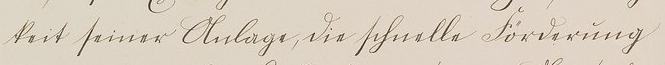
keit seiner Anlage, die schnelle Förderung
